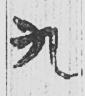九
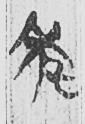年
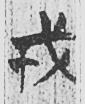戎
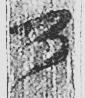乃
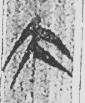大
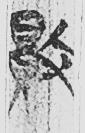敗
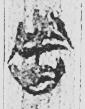周
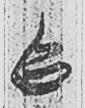𠂤
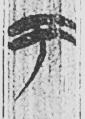于
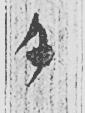千
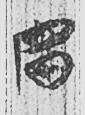{母田}
